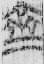齊
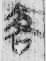客
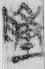○（陳）
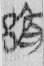豫
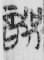○（賀）
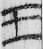王
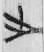之
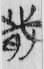歲（歲）
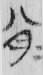八月
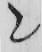乙
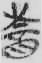梄（酉）
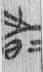之日
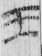王
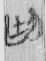○（廷）
